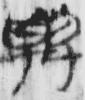與
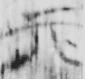亓（其）
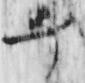父
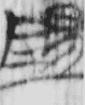○（陽）
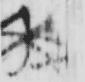年
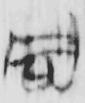同
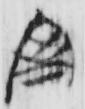室
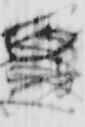○（夏）
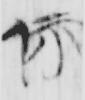𫵖
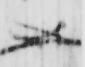之
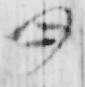月
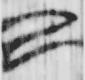己
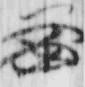梄（酉）
